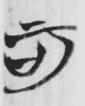可
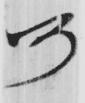乃
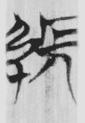張
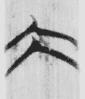大
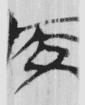{厂矢}
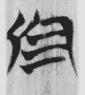於
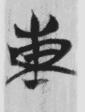東
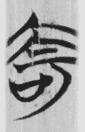奇
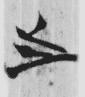之
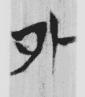外
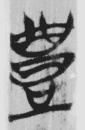豊
